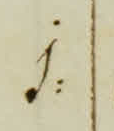1:
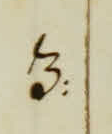3:
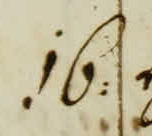16:
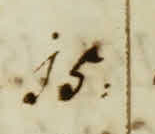15:
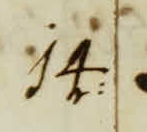14:
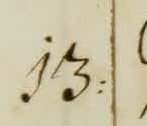13:
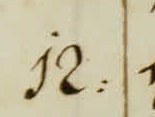12:
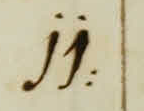11:
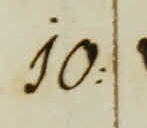10:
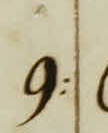9:
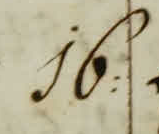16:
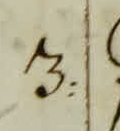3:
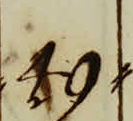49
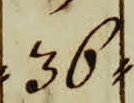36
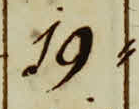19
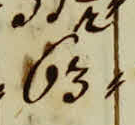63
